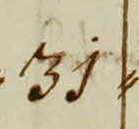31
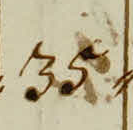35
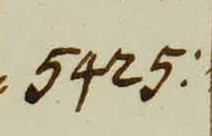5425
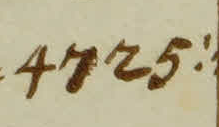4725
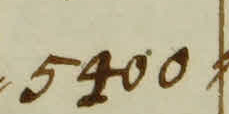5400
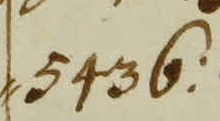5436
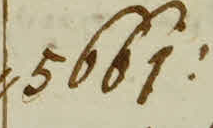5661
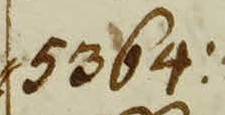5364
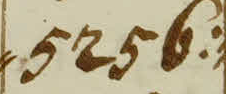5256
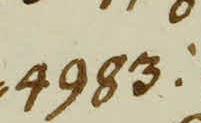4983
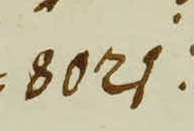8021
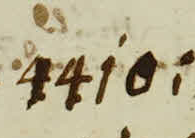4410
